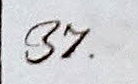37.
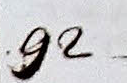92
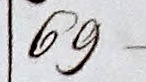69
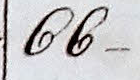66
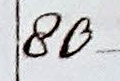80
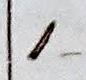1
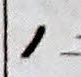1
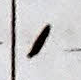1
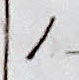1
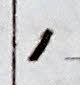1
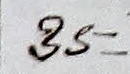35
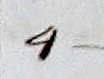4
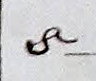5
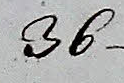36
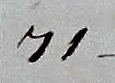71
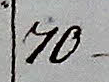70
